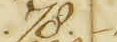78.
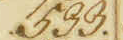533.
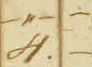4.
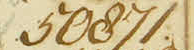50871.
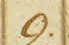9.
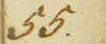55.
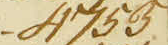4753.
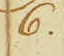6.
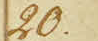20.
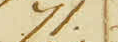71.
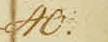40.
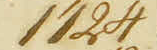1124.
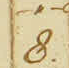8.
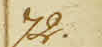72.
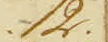12.
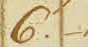6.
